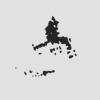十月
